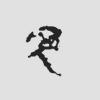夏
